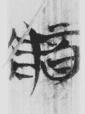𨟻
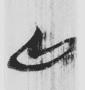㠯（以）
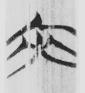夾
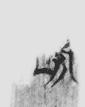{須立}
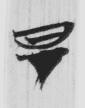旦
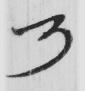乃
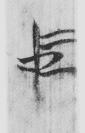𠁩
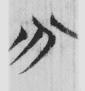分
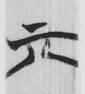亓
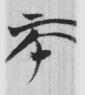帀
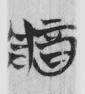𨟻
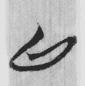㠯（以）
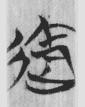御
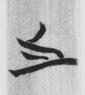之
